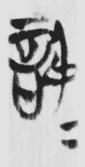言身=
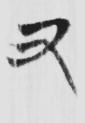又
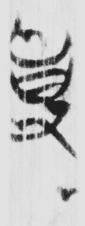事
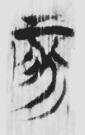所
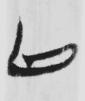㠯（以）
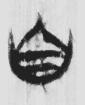自
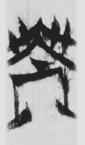{亠舛几}
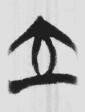立
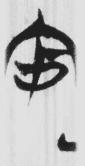{宀𠁩}
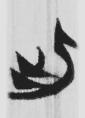此
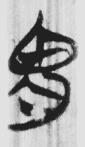胃
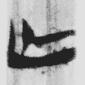亡
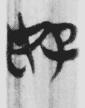好
